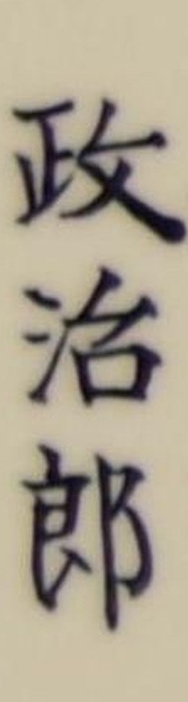政治郎
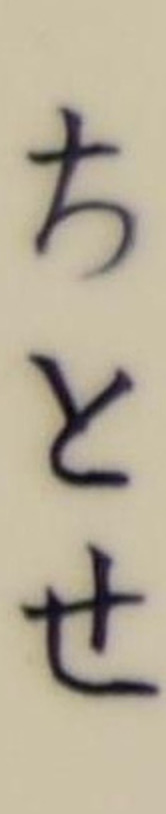ちとせ
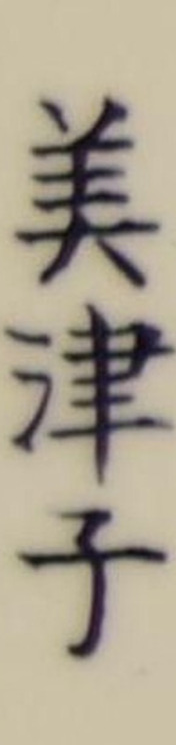美津子

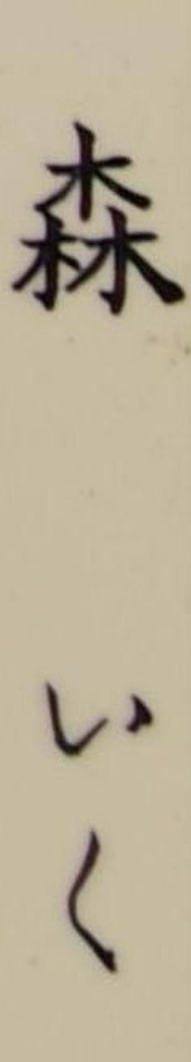森いく
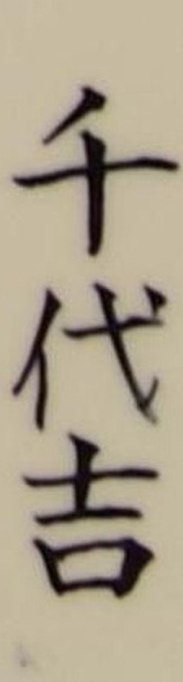千代吉
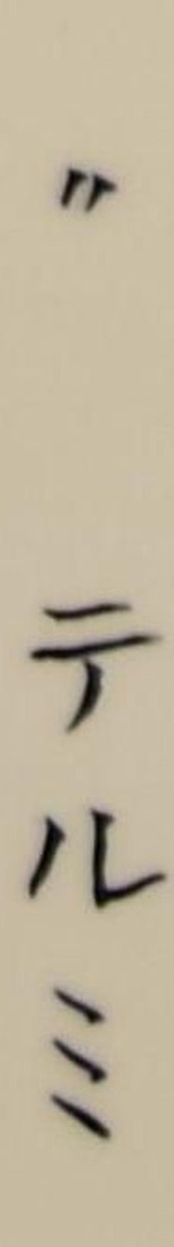テルミ
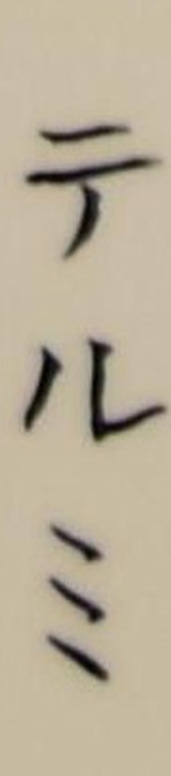テルミ
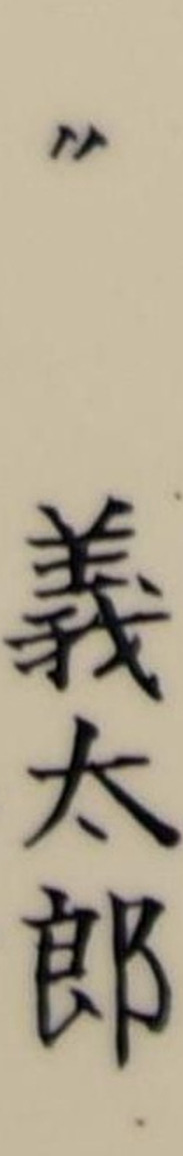義太郎
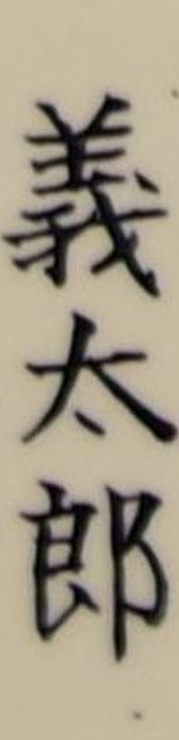義太郎
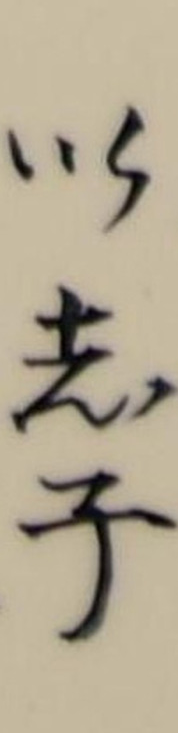いし子
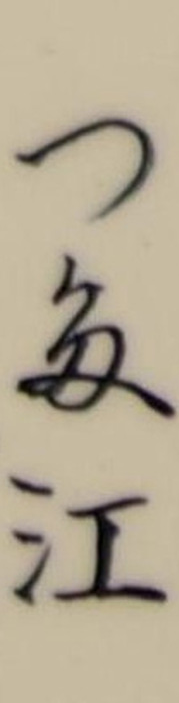つた江
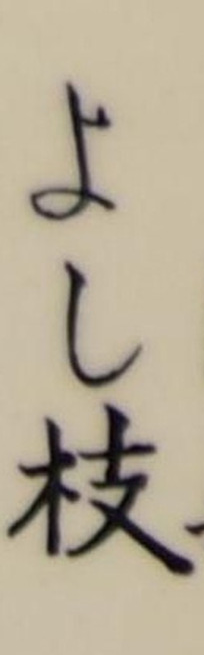よし枝
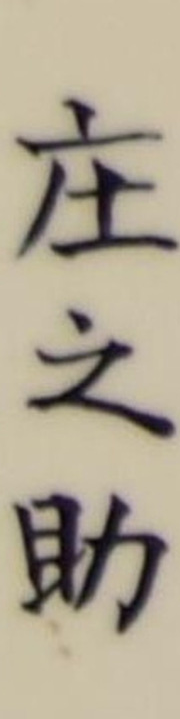庄之助
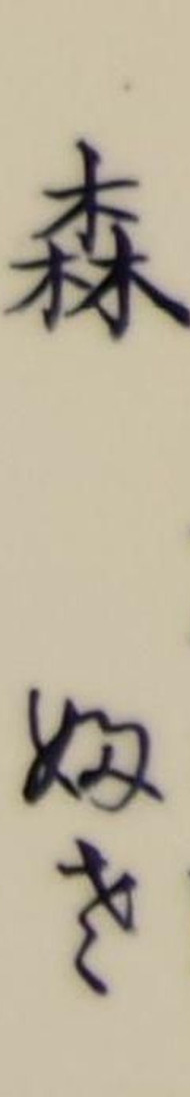森ふさ
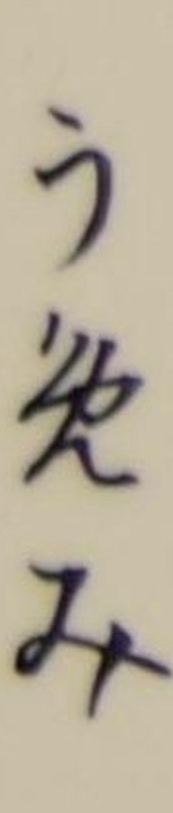うめみ

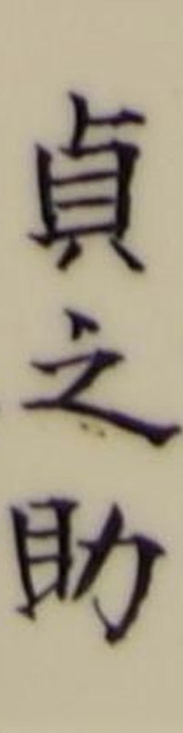貞之助
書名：A~D
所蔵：koyasan kongobuji
